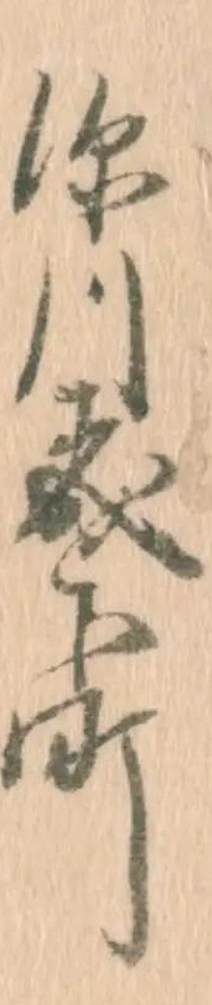深川森下町

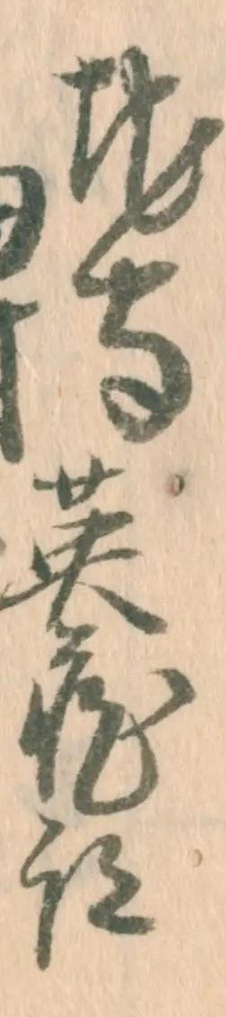地守英蔵跡
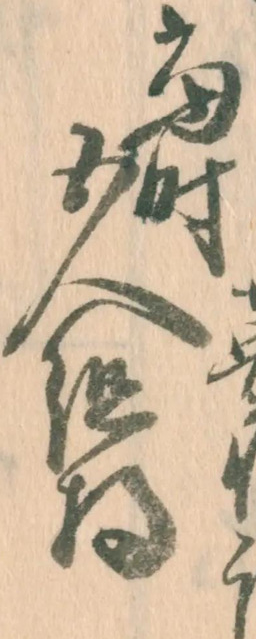当時五人組持

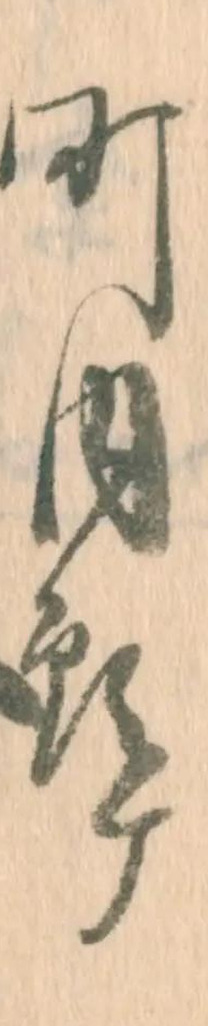町内預ケ
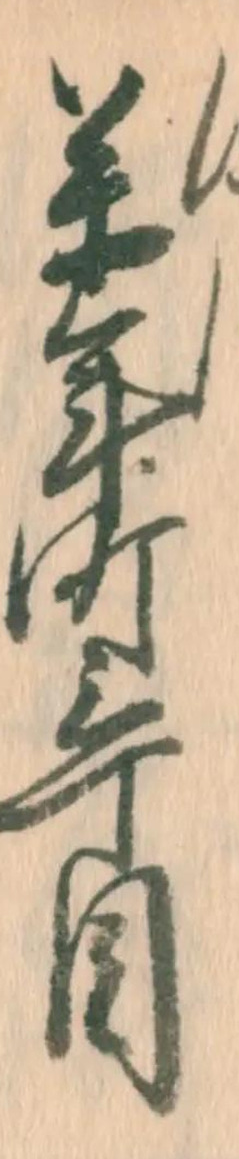万年町三丁目
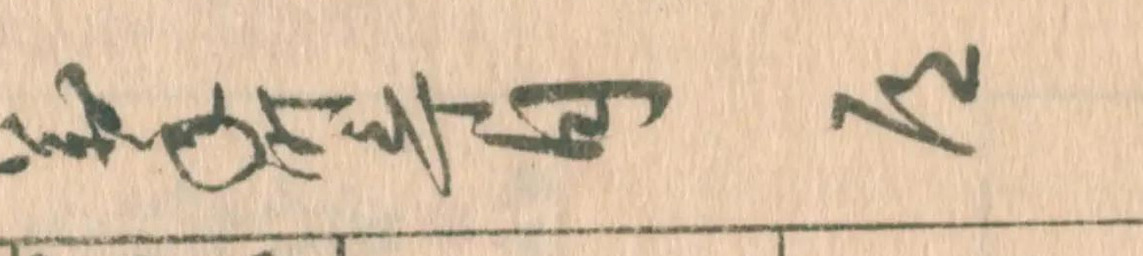万年町三丁目
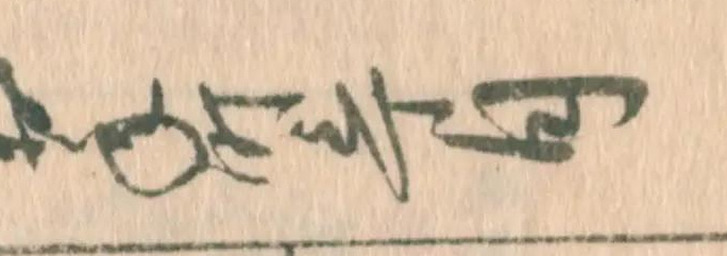万年町三丁目
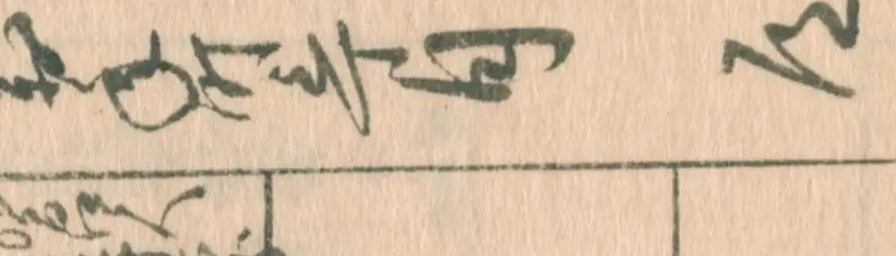万年町三丁目

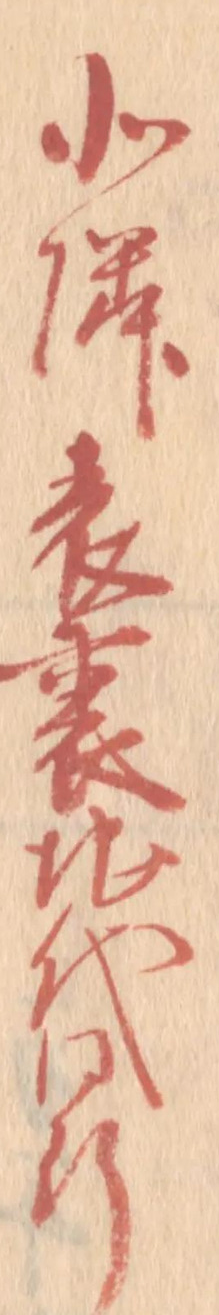北隣表裏地代同断
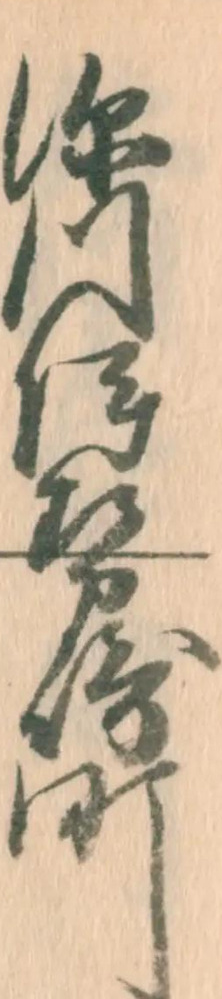深川伊勢崎町

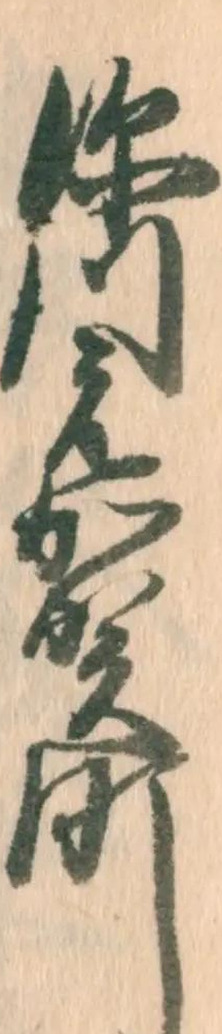深川元加賀町
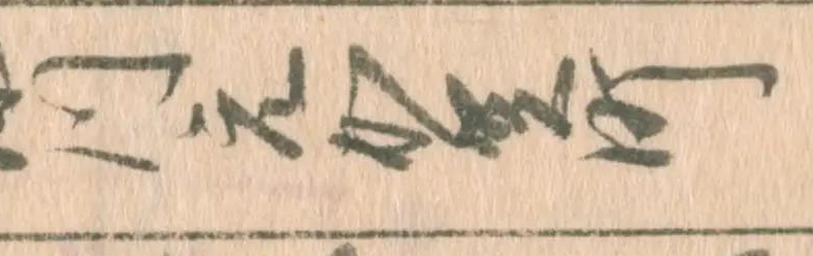深川元加賀町
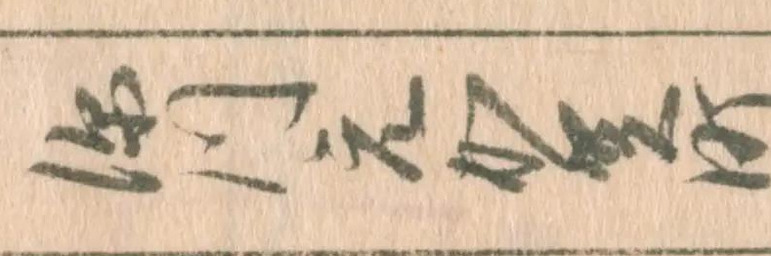深川元加賀町
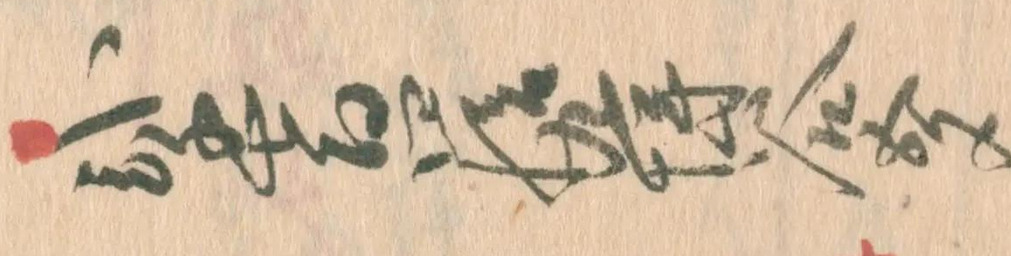●弐千七百四拾九坪六合五勺

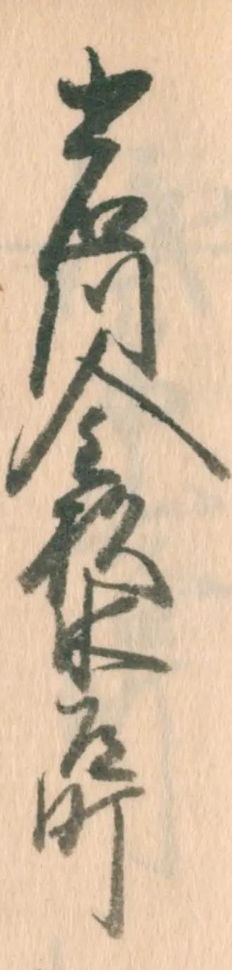小石川金杉水道町
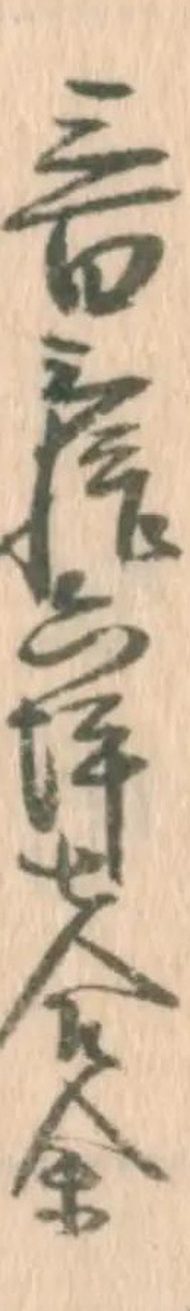●三百三拾六坪七合余
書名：地震災書留 2巻. [1] 内表紙に「地震災書留　安政二卯年　但本所深川御用屋敷地代免除調」とあり
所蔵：国立国会図書館 National Diet Library, JAPAN
